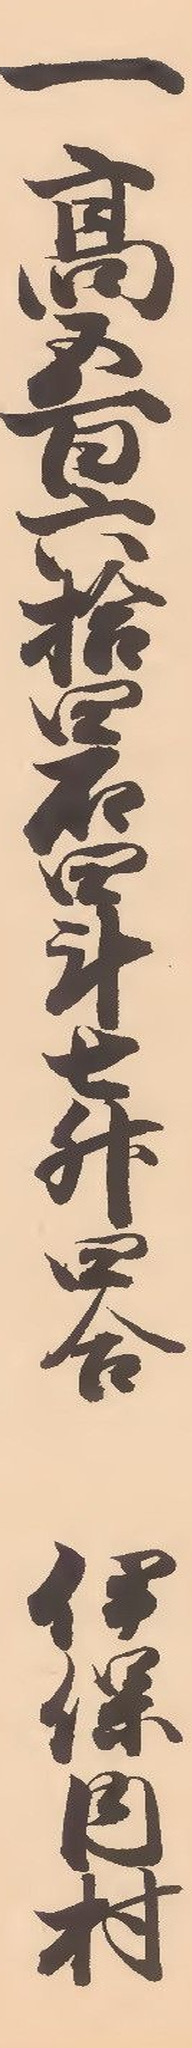一高五百六拾四石四斗七升四合伊保内村
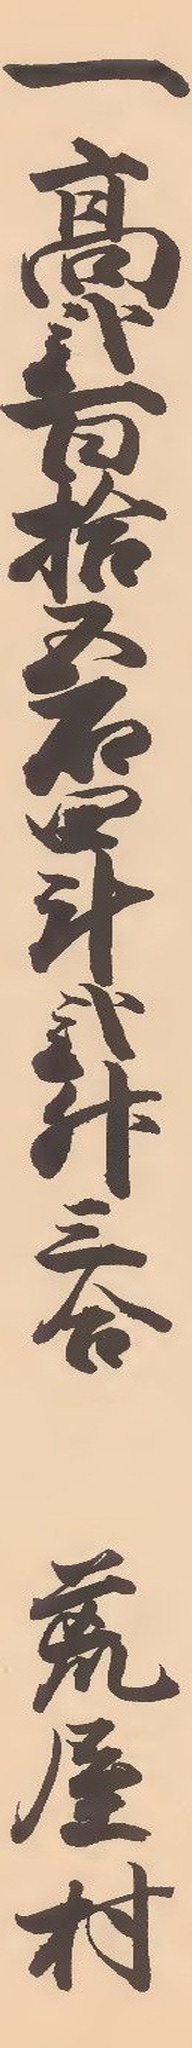一高弐百拾五石四斗弐升三合荒屋村
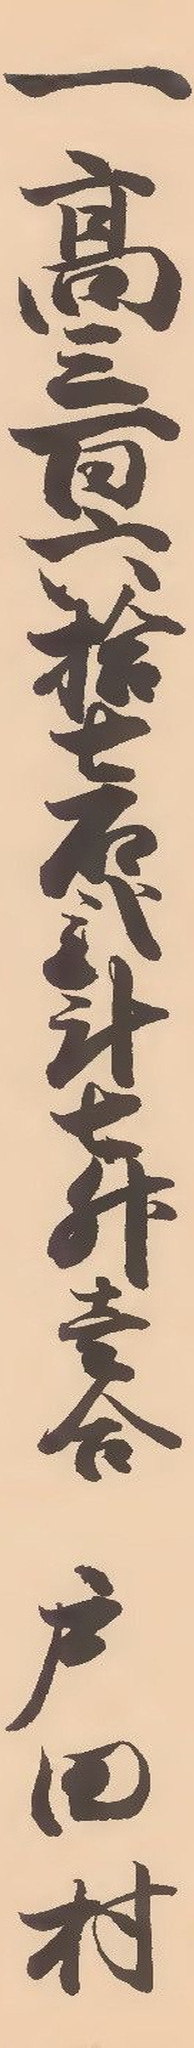一高三百六拾七石弐斗七升壱合戸田村
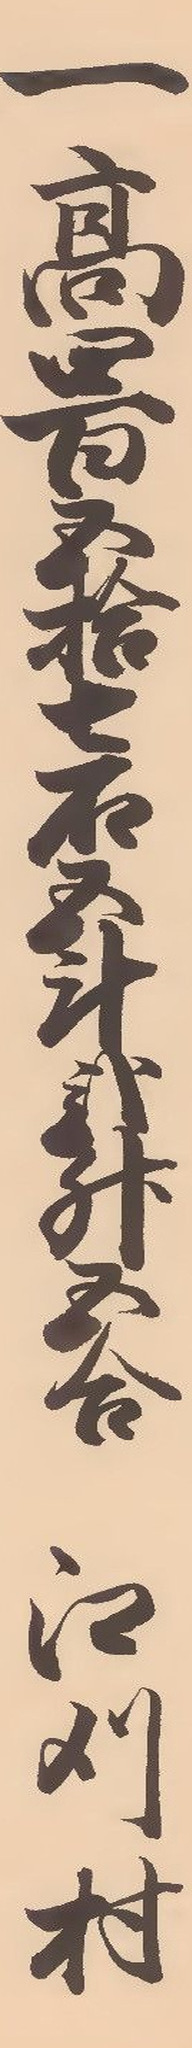一高四百五拾七石五斗弐升五合江刈村
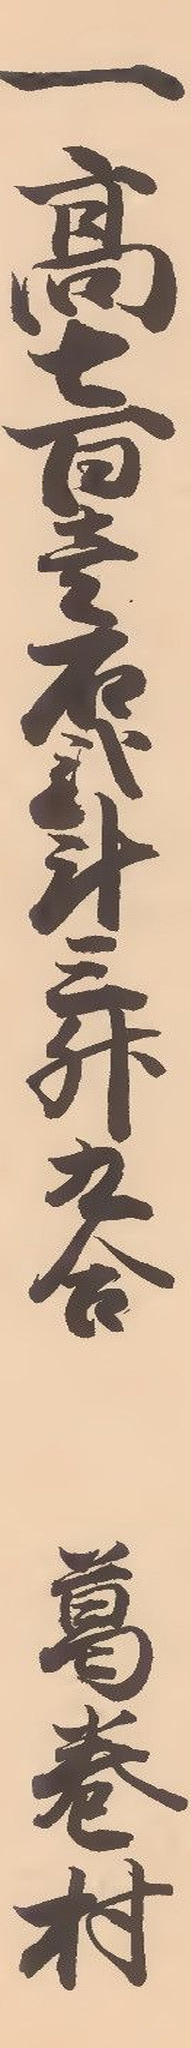一高七百壱石弐斗三升九合葛巻村

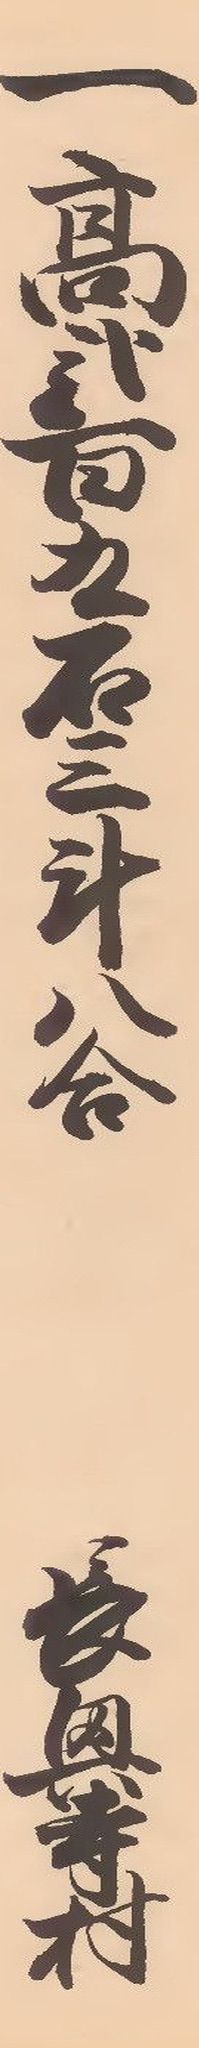一高弐百九石三斗八合長興寺村
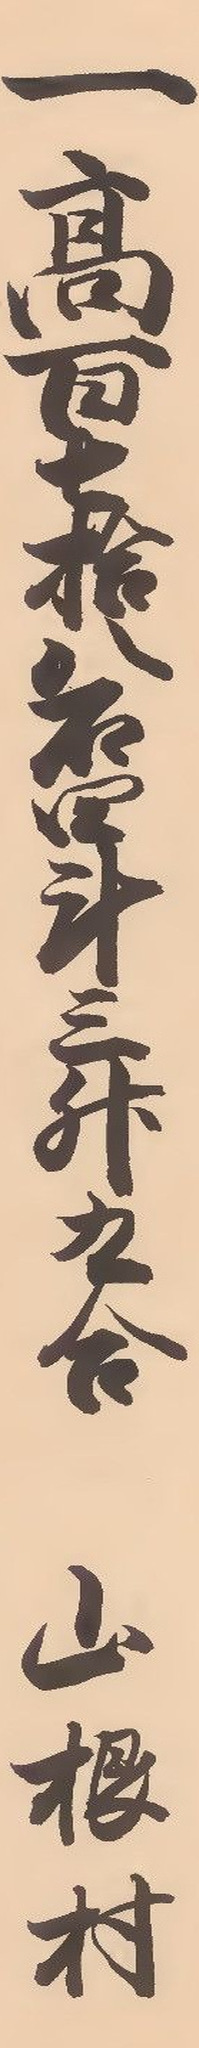一高百七拾八名四斗三升九合山根村
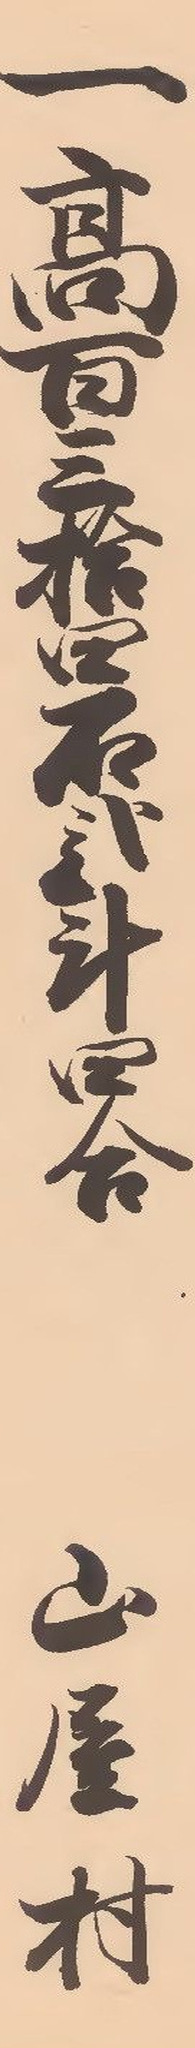一高百三拾四石弐斗四合山屋村
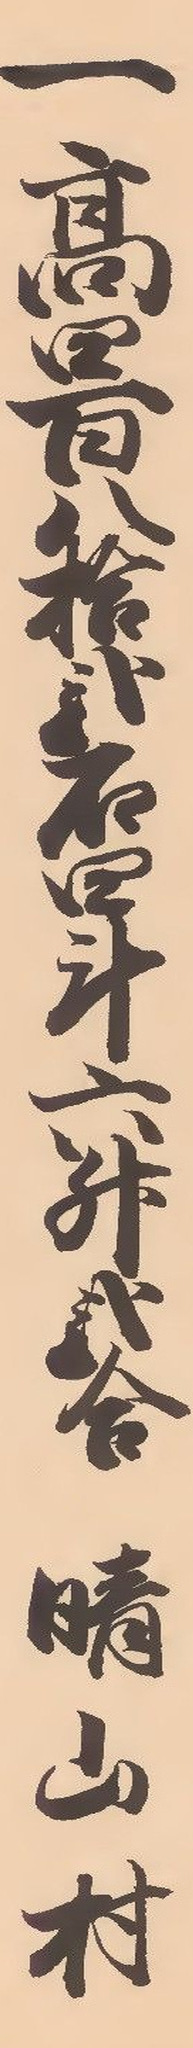一高四百八拾弐石四斗六升弐合晴山村
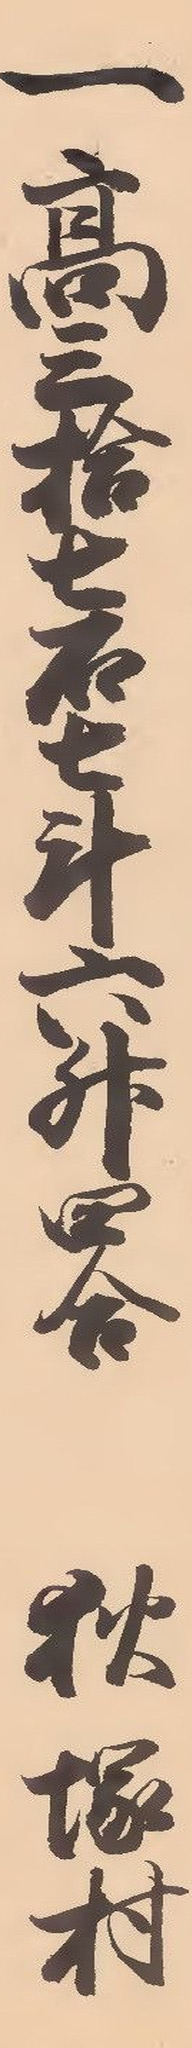一高三拾七石七斗六升四合狄塚村
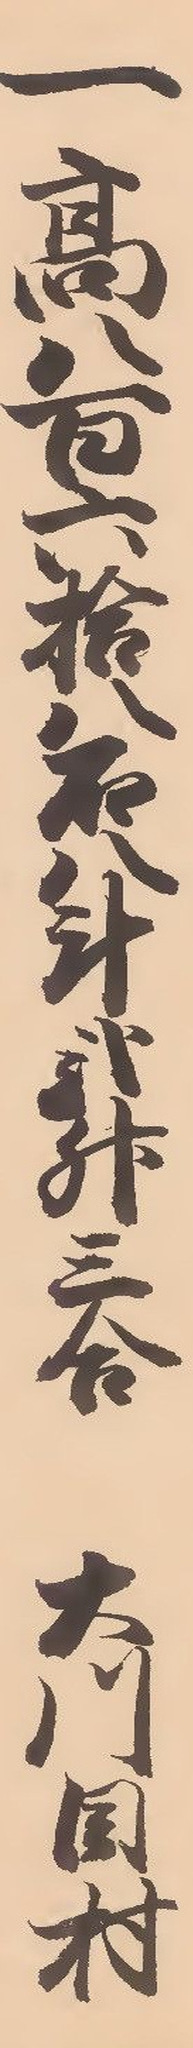一高八百六拾八石八斗弐升三合大川目村
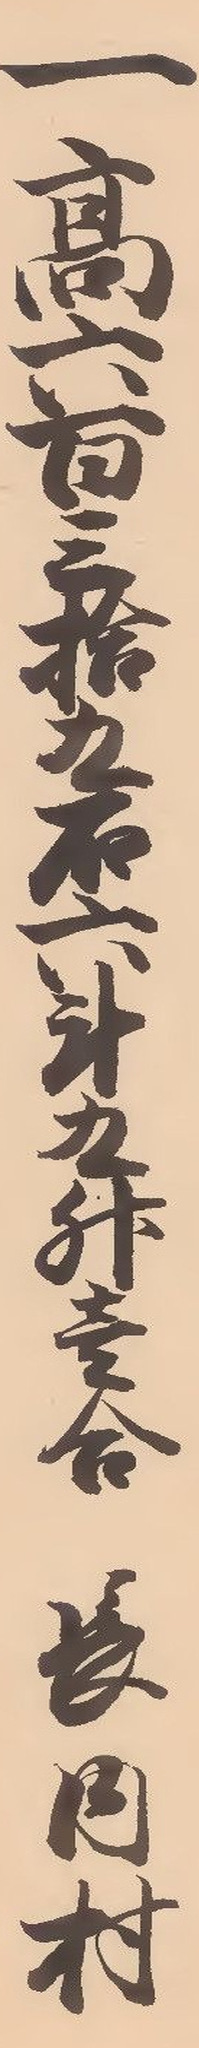一高六百三拾九石六斗九升壱合長内村
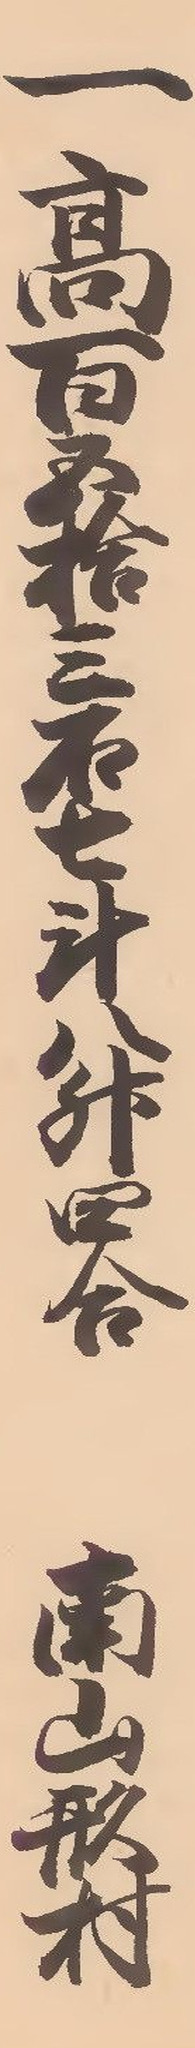一高百五拾三石七斗八升四合南山形村

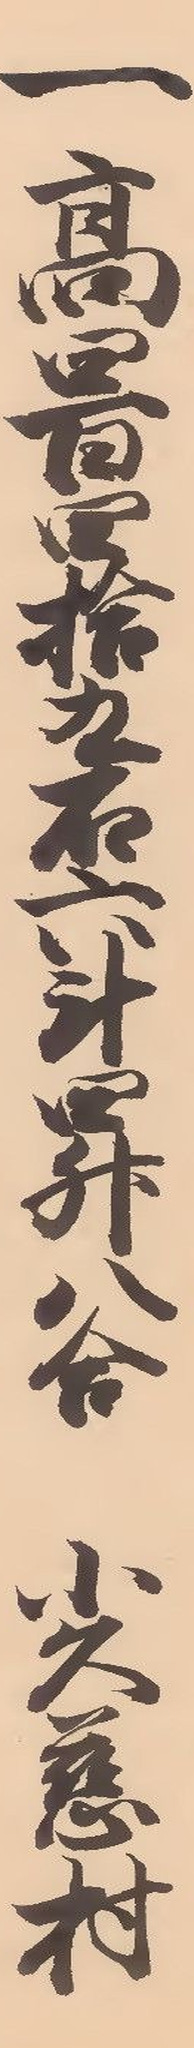一高四百四拾九石六斗四升八合小久慈村
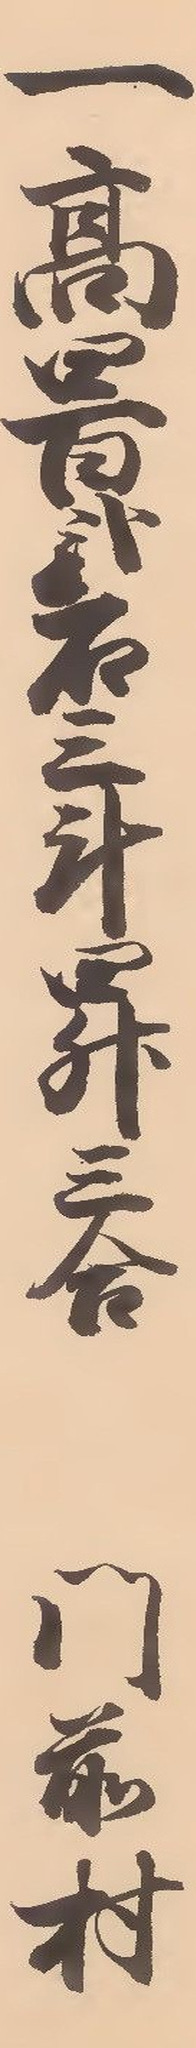一高四百弐石三斗四升三合門前村
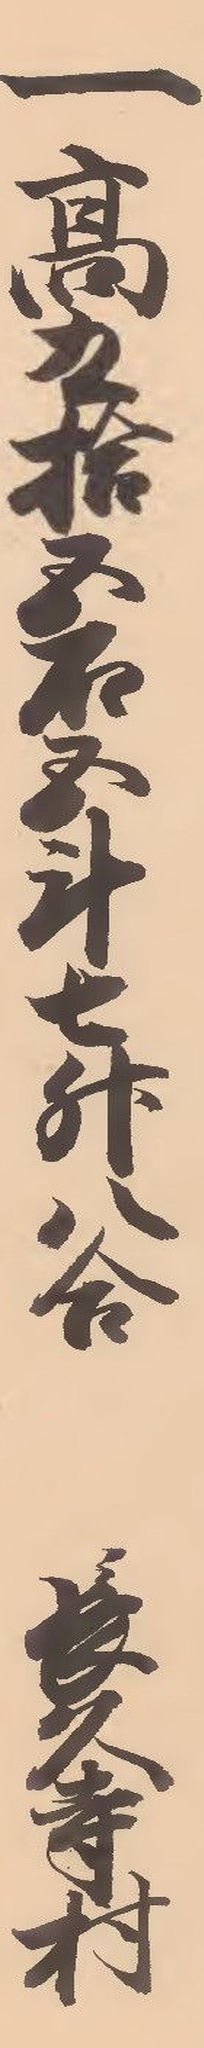一高九拾五石五斗七升八合長久寺村
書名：陸奥国郷帳　６
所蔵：国立公文書館 National Archives of Japan
